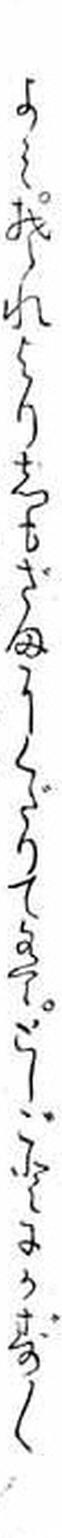よみ。それよりしもざまにくだりては。としごとにかず〳〵
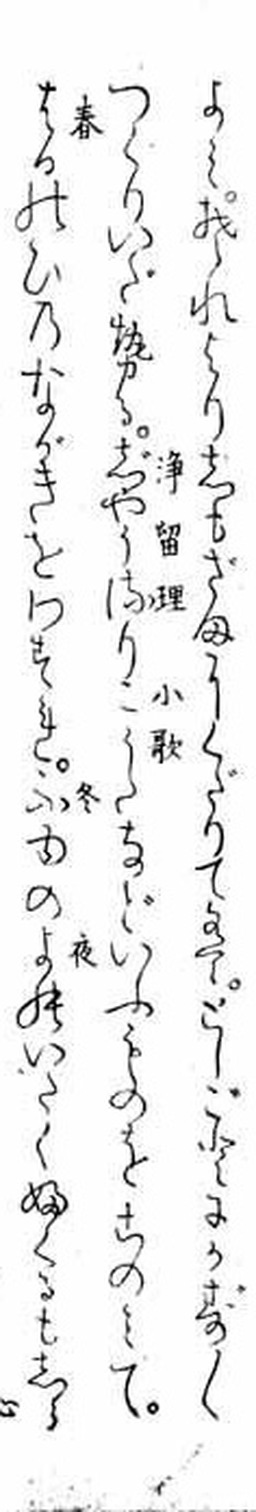つくりいだせる。じやうるりこうたなどいふものをこのみて。
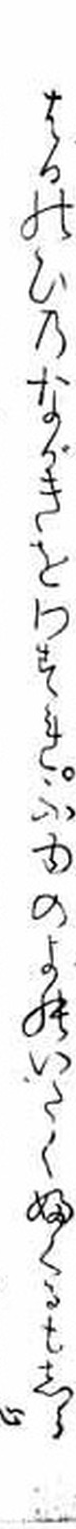はるのひのながきをわすれ。ふゆのよのいたくふくるもしら
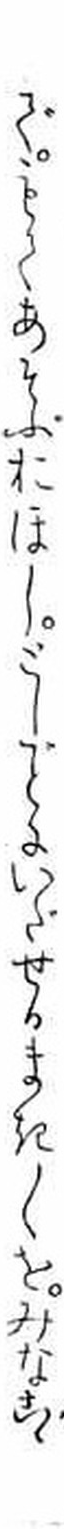で。もてあそぶおほし。としごとにいだせるまき〳〵を。みなこゝ
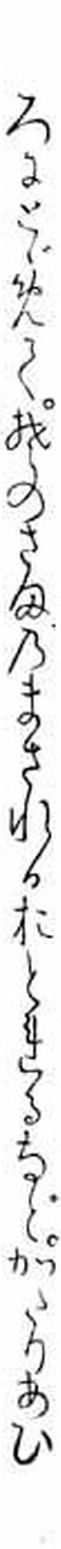ろにとゞめて。そのさまのまされるおとれるなど。かたりあひ
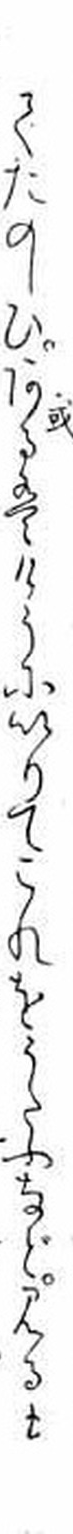てたのしひ。あるはけうにいりてこれをうたふなど。見るも
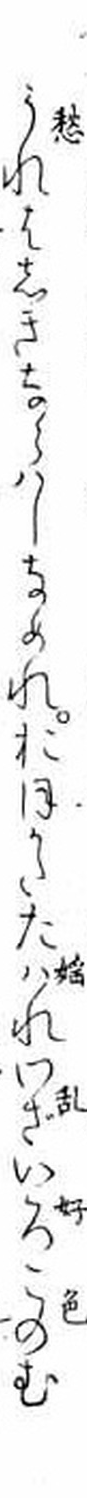うれはしきならはしなめれ。おほかたたはれわざいろこのむ
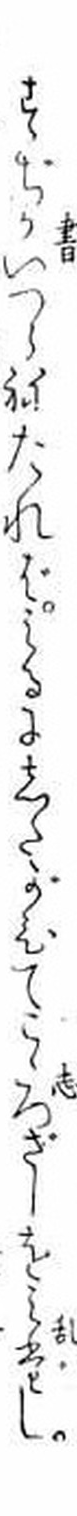すぢかいつらねたれば。みるにしたがひてこゝろざしをみだし。
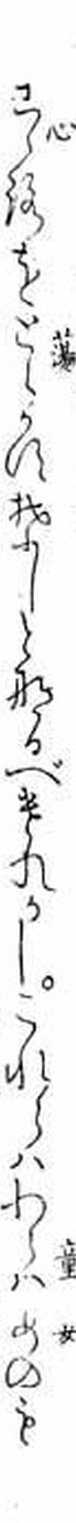こゝろをとらかすはしとなるべけれかし。これらはわらはめのも
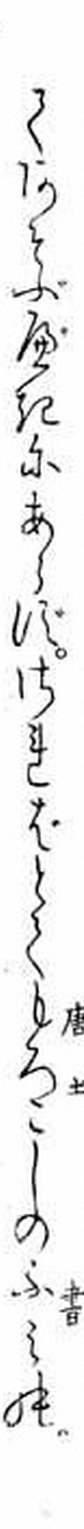てあそぶべきにあらず。さればとてもろこしのふみの。
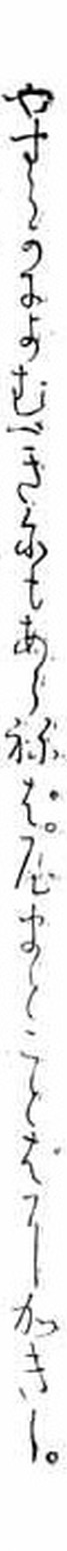やすらかによむべきにもあらねば。やまとことばにかきし。
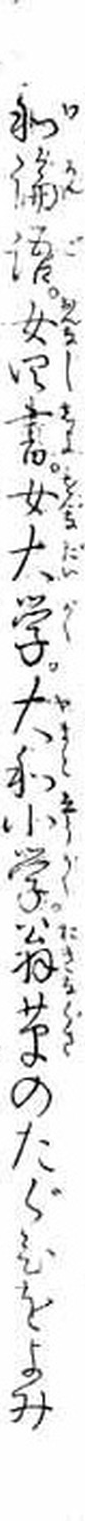和論語。女四書。女大学。大和小学。翁草のたぐひをよみ
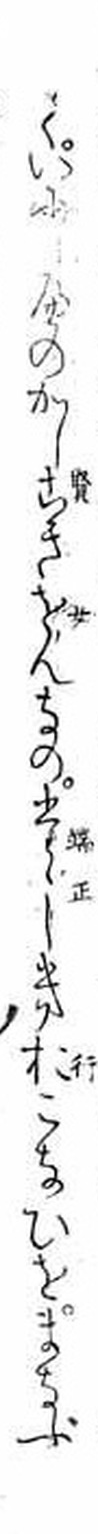て。いにしへのかしこきをんなの。たゞしきおこなひを。まなぶ
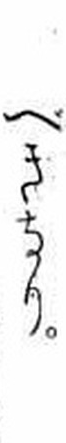べきなり。
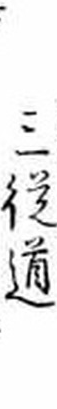三従道
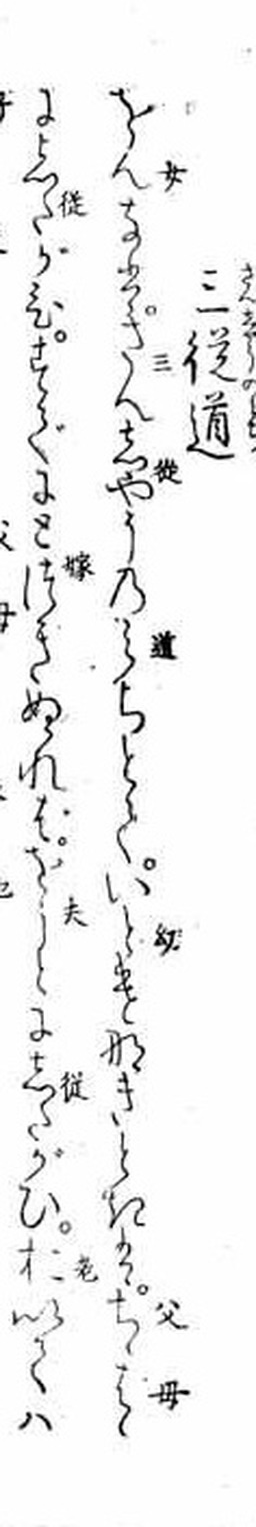をんなは。さんしやうのみちとて。いとけなきときは。ちゝはゝ
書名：女学範
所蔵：東京学芸大学教育コンテンツアーカイブ
